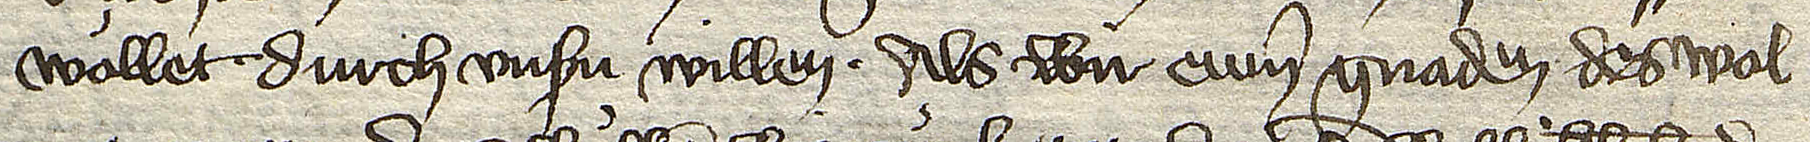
wöllet durch vnſ*n willen . Als wir ewn* gnaden des wol
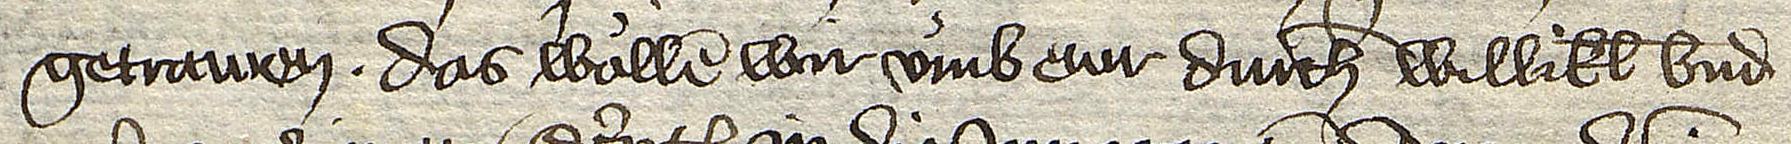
getrawen . das wölle* wir v̈mb ewr durch* willik* vnd
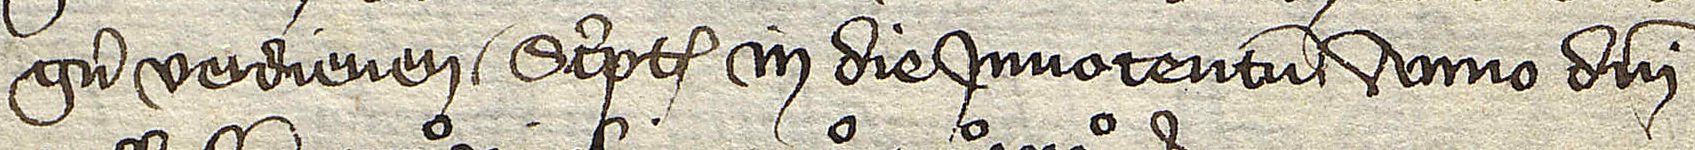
gn* verdienen / Sc*pt* in die Innocentu* Anno dni*
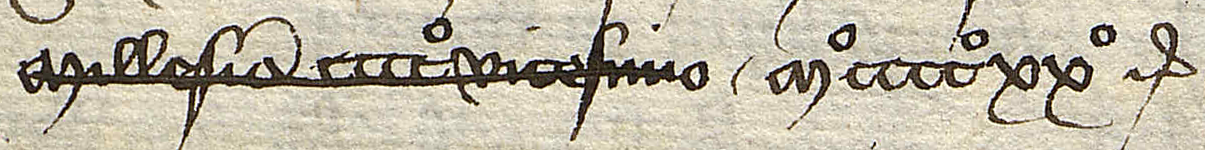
Milleſio* cccc* viceſimo / M* cccc* xx* §
